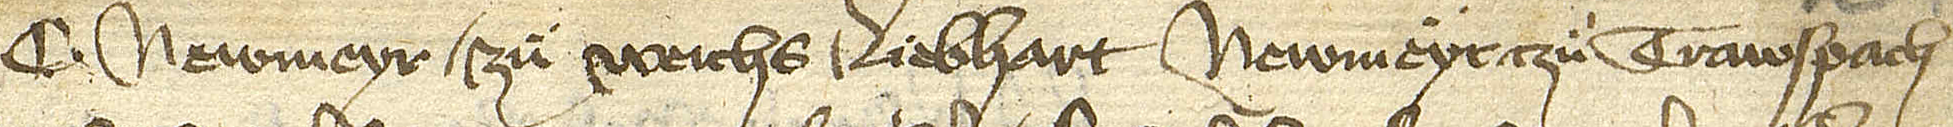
C . Newmeyr / cʒü weichs / Liebhart Newmeyr cʒü Trawſpach
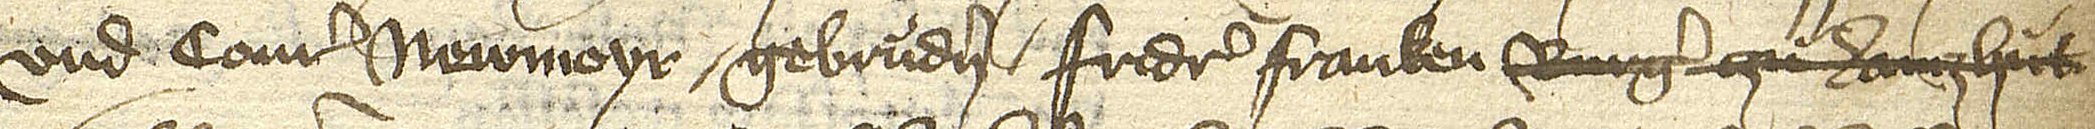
vnd Conr* Newmeyr / gebrüdn* / Fridr* Franken Burg* cʒü Lancʒhüt
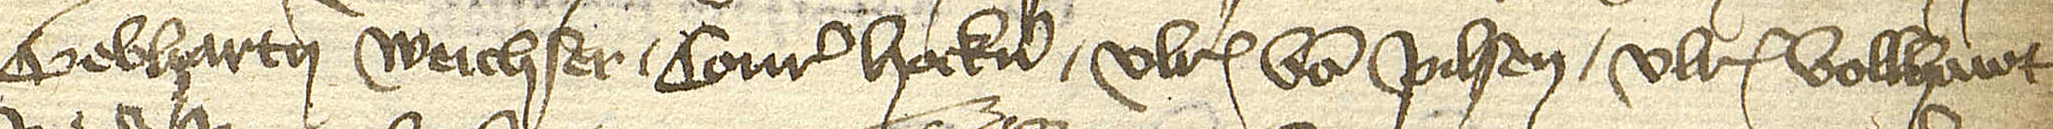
Gebhartn* weichſer / Conr* Hockn* / vlr* vo* Pilſen / vlr* vollhawt
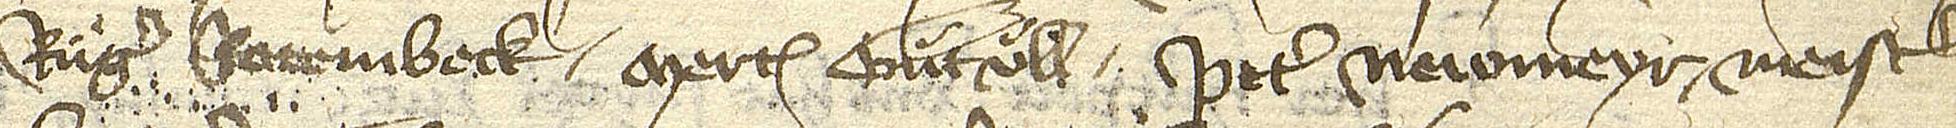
Rüg* Rotembeck / Mert* Gütv̈ll / Pet* Newmeyr / meiſt*
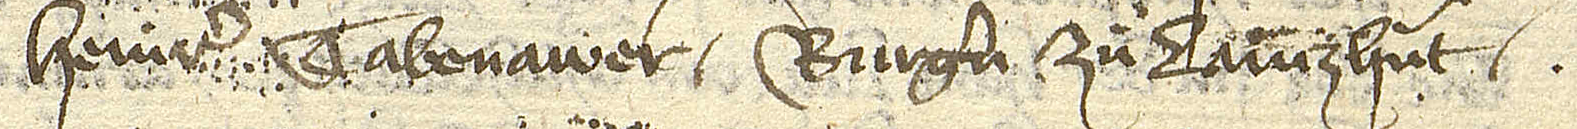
heinr* Tabenawer / Burg*n cʒü Lancʒhüt / .
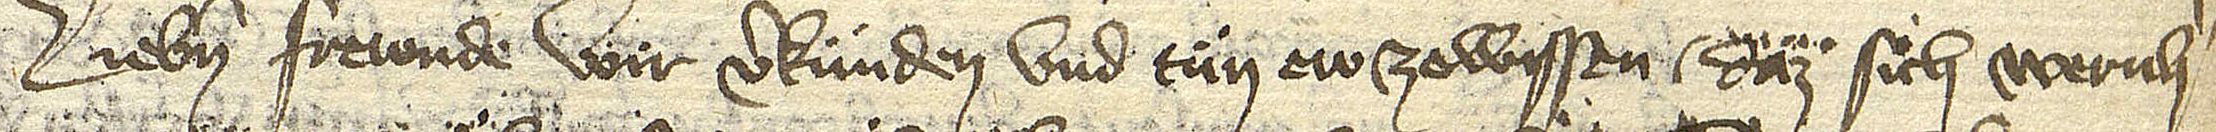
Liebn* frewnde Wir v*künden vnd tün ew cʒewiſſen / daʒ ſich wernh*
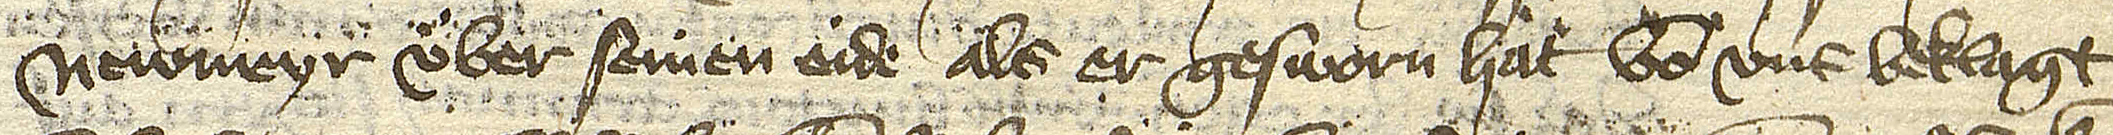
Newmeyr v̈ber ſeinen eide als er geſworn hat vo* vns beklagt
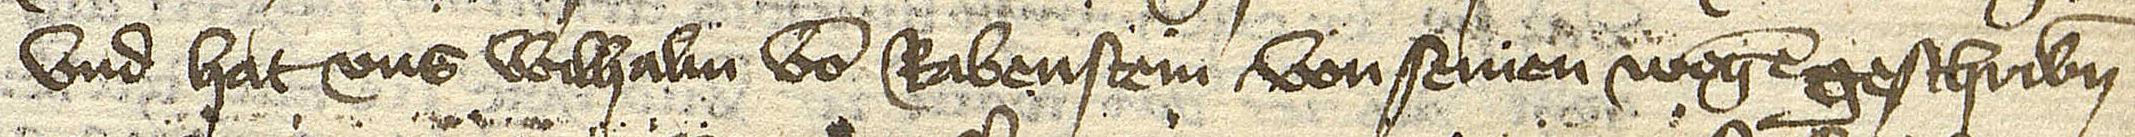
vnd hat vns wilhalm vo* Rabenſtein / von ſeinen wege* geſchribn*
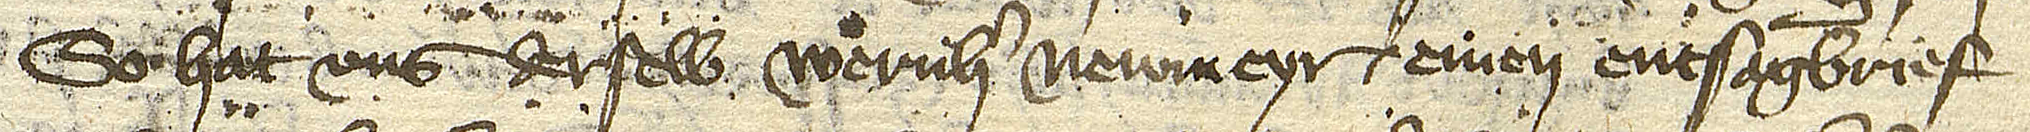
So hat vns derſelb wernh* Newmeyr / einen entſagbrief
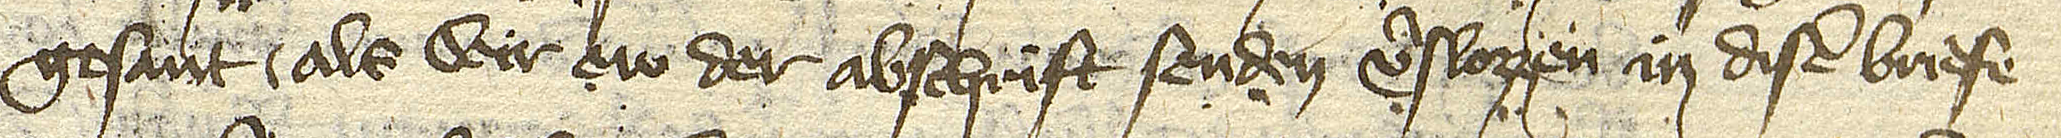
geſant / als wir ew der abſchrift ſenden v*ſloʒʒen in diſe* briefe
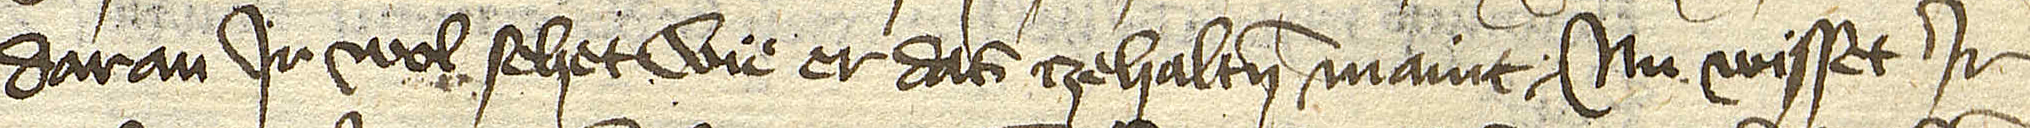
daran Ir wol ſehet wie er das cʒehaltn* maint / Nu wiſſet Ir
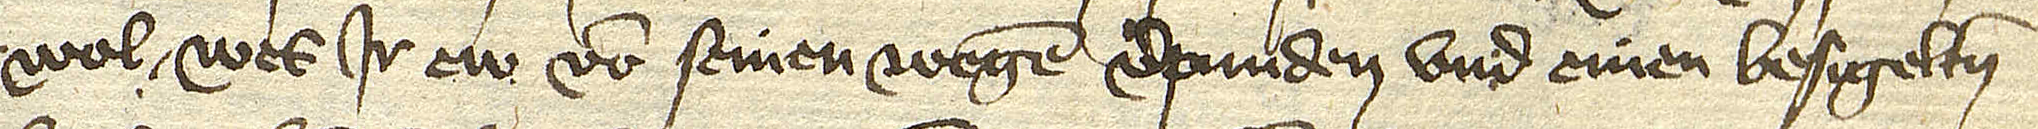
wol / wes Ir ew vo* ſeinen wege* v*punden vnd einen beſigeltn*
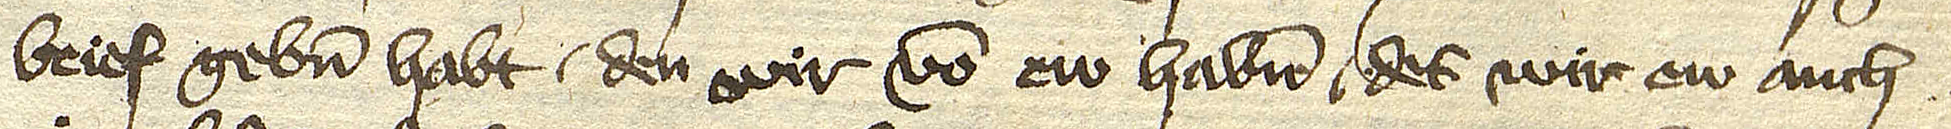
brief gebn* habt / den wir vo* ew habn* / des wir ew auch
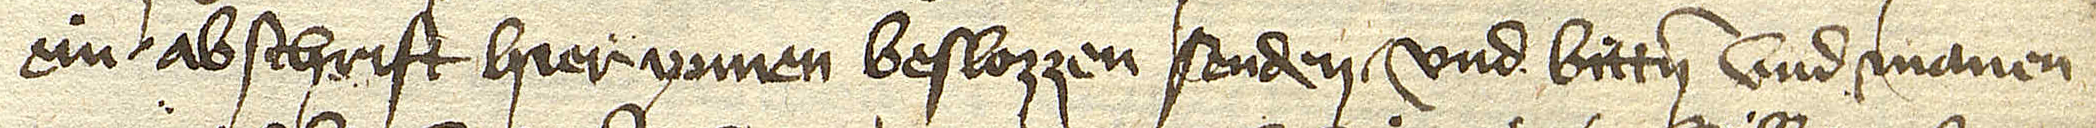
ein / abſchrift hierynnen beſloʒʒen ſenden / vnd bittn* vnd manen
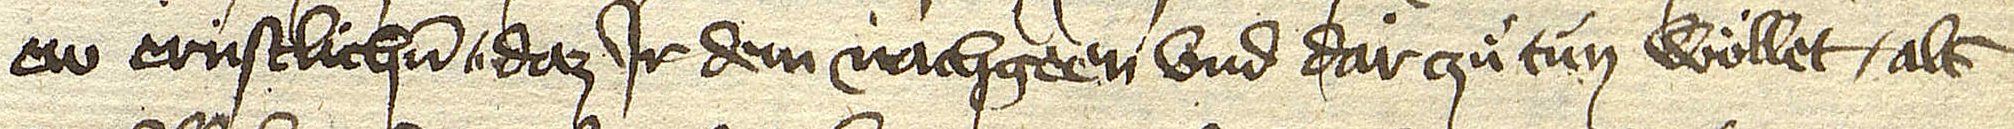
ew ernſtlichn* / daʒ Ir dem nachgeen vnd darcʒü tün wöllet / als
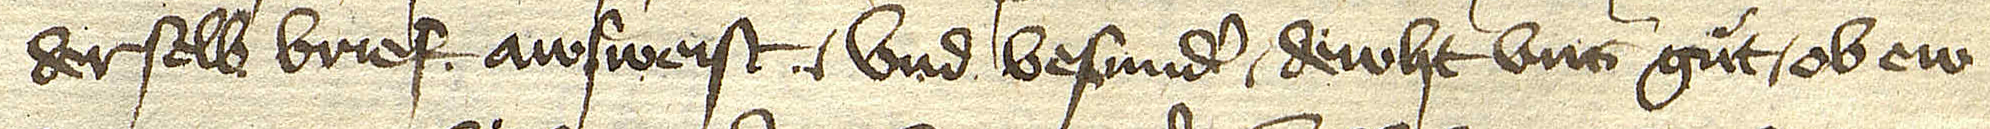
derſelb brief awſweiſt . / vnd beſund* / dewht vns güt / ob ew
